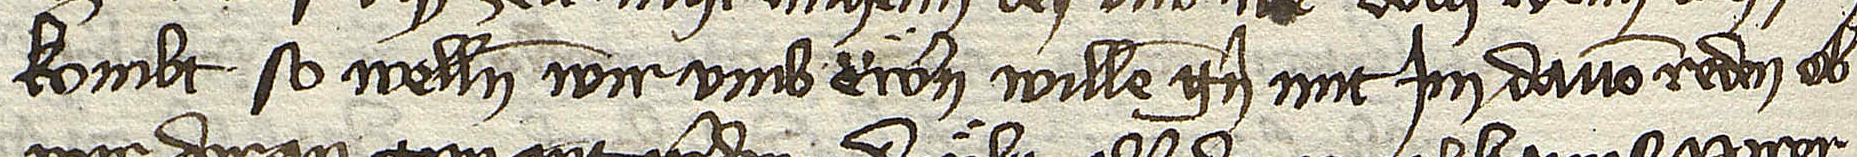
kombt ſo welln* wir vmb eẅ*n wille* g*n mit Im dauo* reden Ob
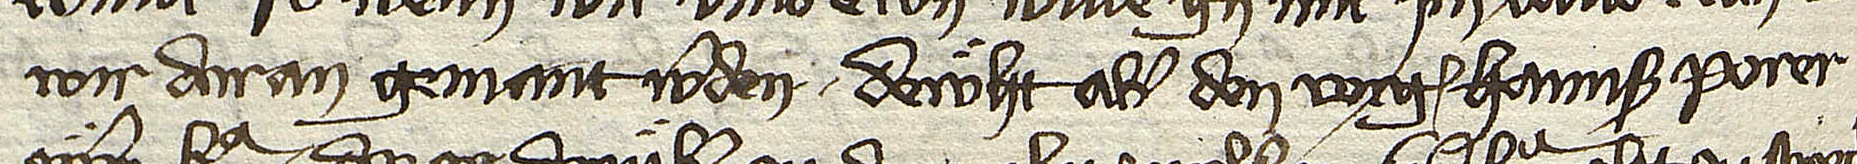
wir daran gemant w*den / Deẅht ab* den vorg* hannſ* Porer
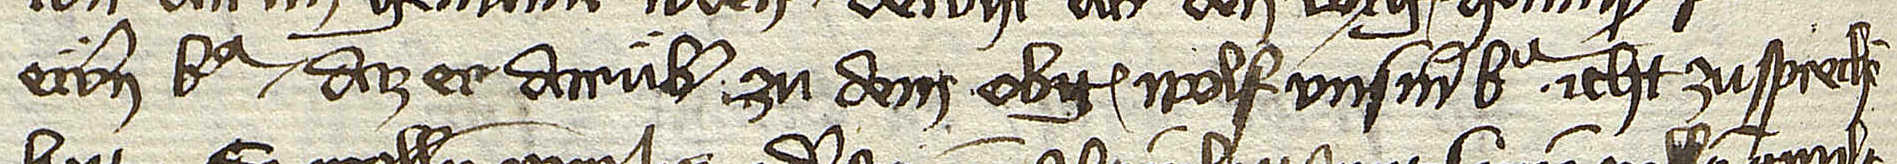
eẅ*n b* / daʒ er darüb* ʒu dem obg* wolf vnſm* b* icht ʒuſpreche*
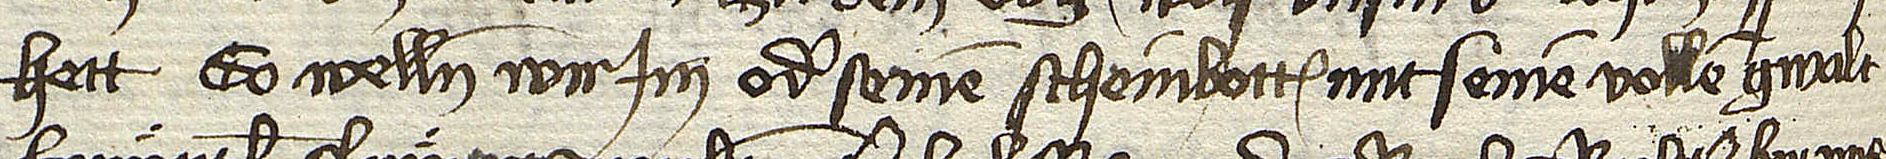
hett So welln* wir Im od* ſeine* ſcheinbott* mit ſeine* volle* gwalt
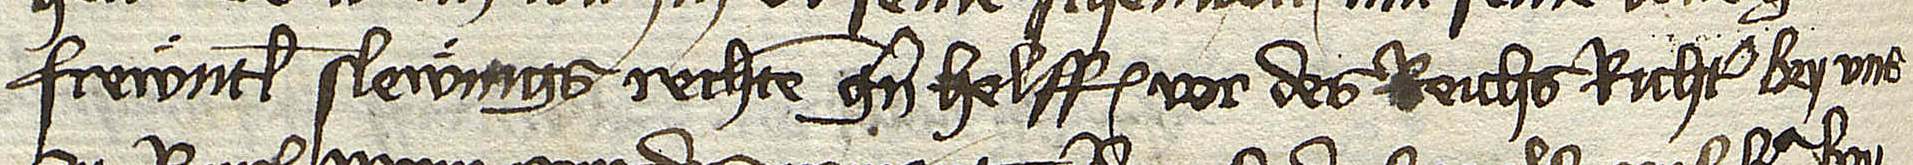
freẅntl* ſleẅnigs rechte* g*n helff* vor des Reichs Richt* bey vns
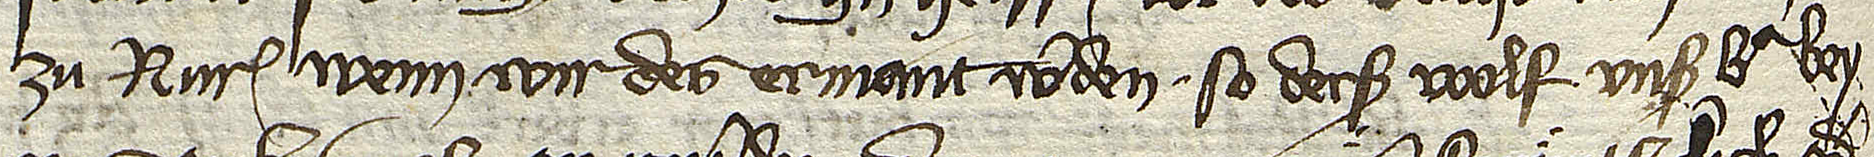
ʒu Nur* wenn wir des ermant w*den ſo derſ* wolf vnſ* b* bey
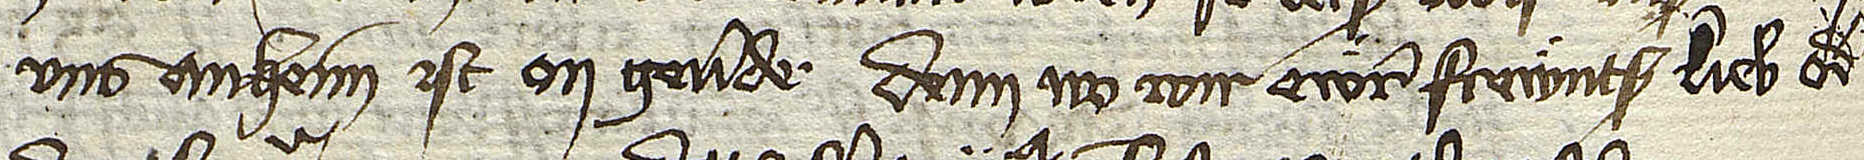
vns anheim iſt on geu*de . Denn wo wir eẅr* freẅntſ* lieb od*
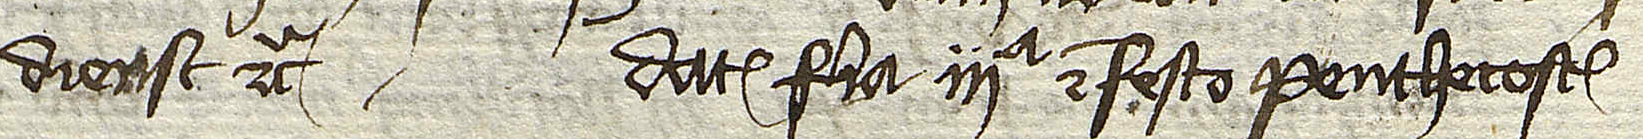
dienſt ec* / Dat* fia* iii* i* feſto Penthecoſt*
